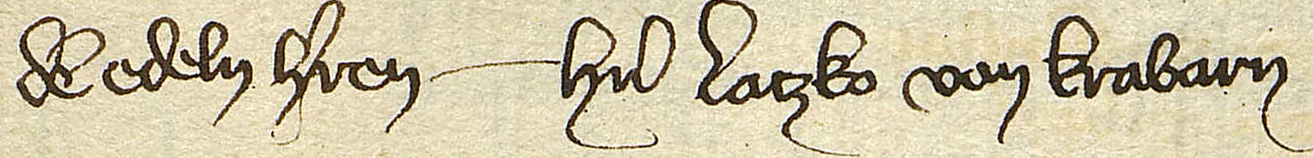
de* edeln h*ren / hn* Lacʒko von krabarn
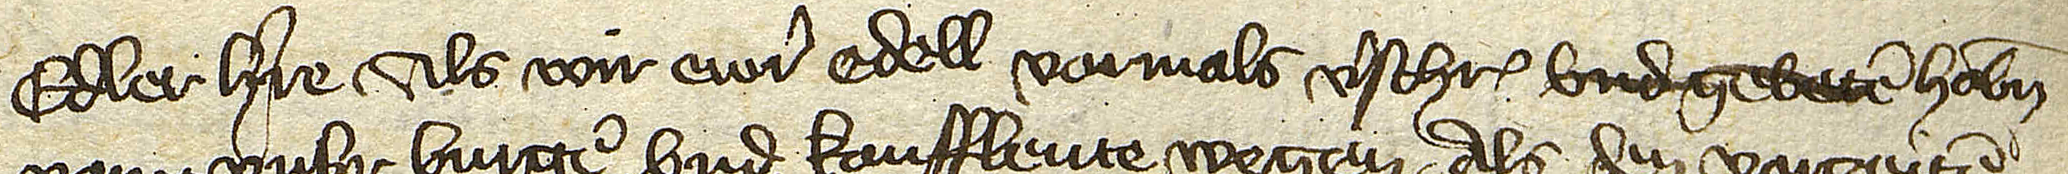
Edler h*re / Als wir ewr* edell vormals v*ſchr* vnd gebete* habn*
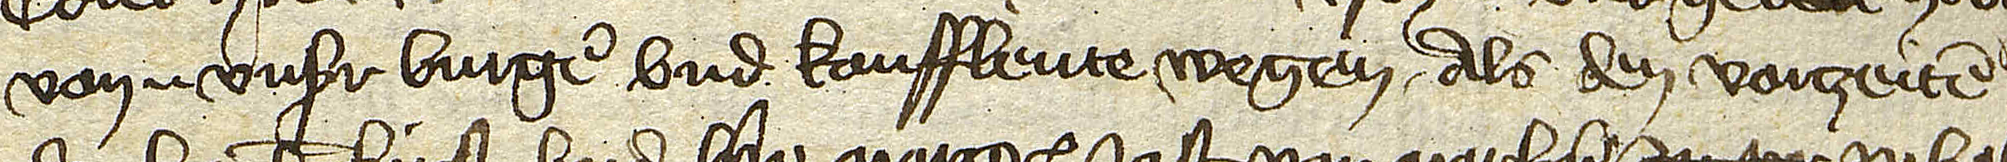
von ~ vnſ*r burge* vnd kauffleute wegen als den vorcʒeite*
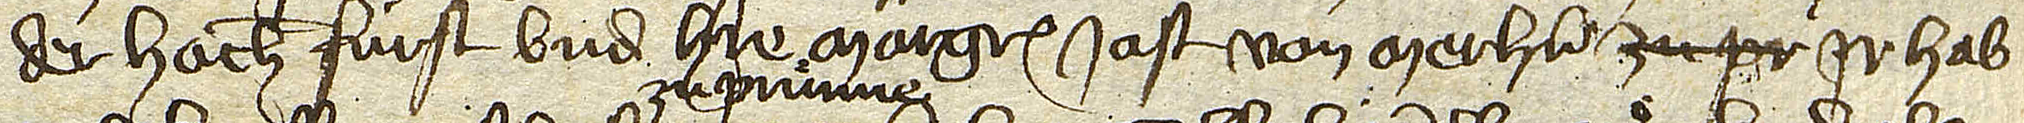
der hoch* fürſt vnd h*re Margr* Ioſt von Merhn* cʒu pr Ir hab
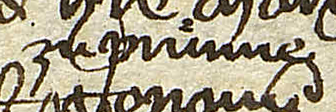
ʒu prünne
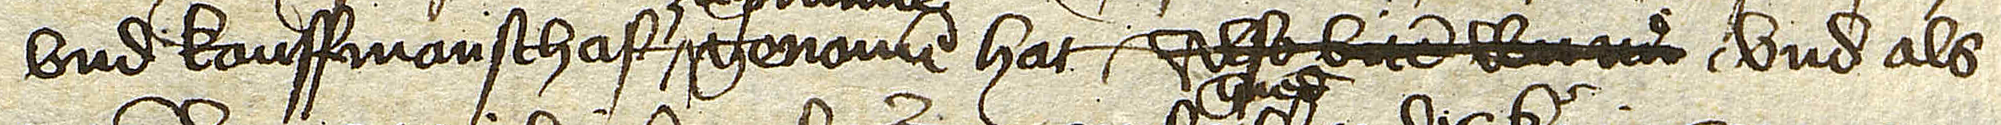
vnd kauffmanſchaft / genome* hat / Alſo bite* wir u / vnd als
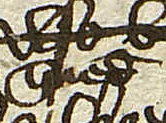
gned*
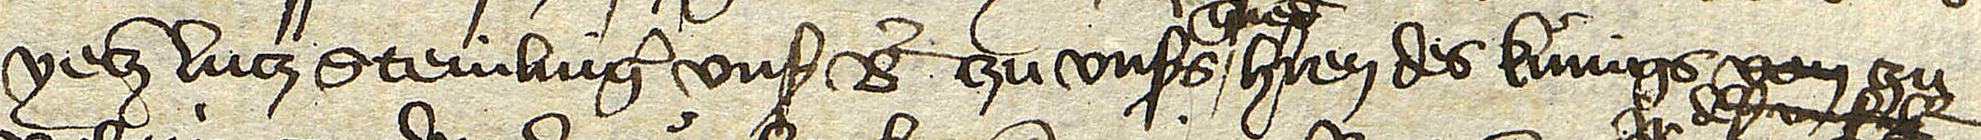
yecʒ* lucʒ Steinling* vnſ* B* cʒu vnſ*s h*ren des künigs von cʒu
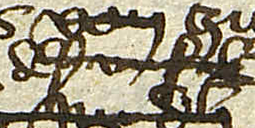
deſ* vnſ* b*
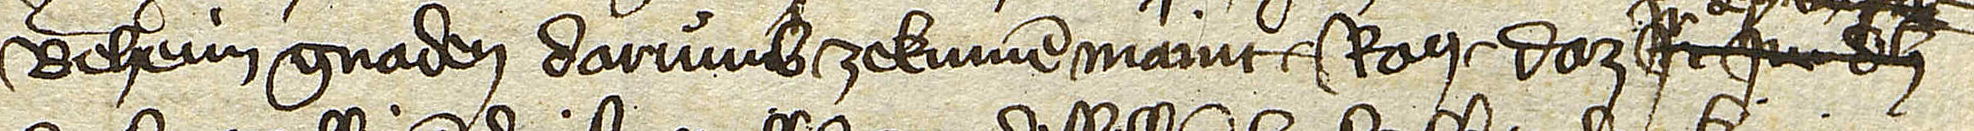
Beheim gnaden darumb cʒekume* maint / Ro* / daʒ Ir Im d*h
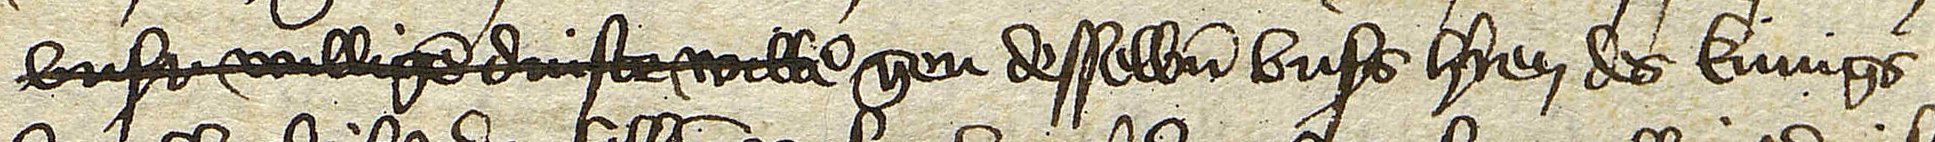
vnſ*r willige* dinſte wille* gen deſſebn* vnſ*s h*ren des künigs
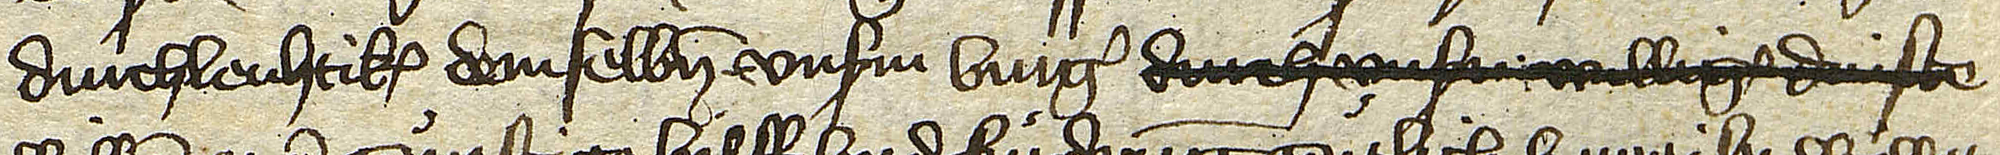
durchleuhtik* demſelbn* vnſ*m burg* durch vnſ*n willig* dinſte
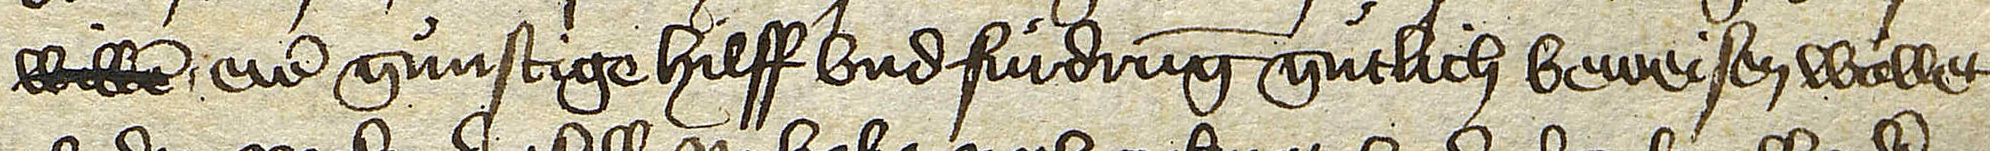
wille* ew* günſtige hilff vnd fürdrug* gütlich beweiſen wöllet
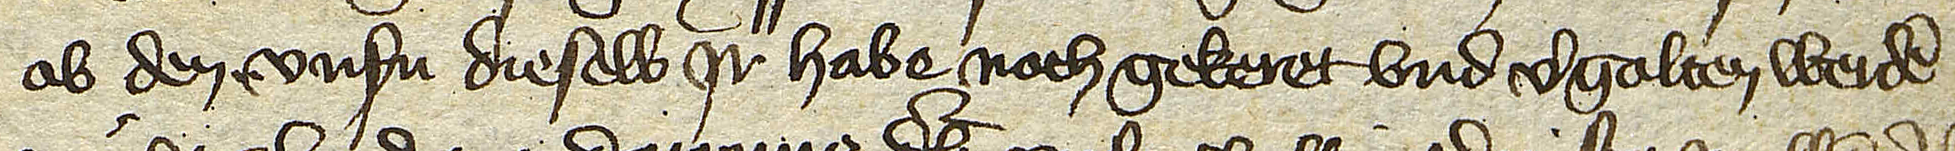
ob den ~ vnſ*n dieſelb Ir habe noch gekert vnd v*golten werd*
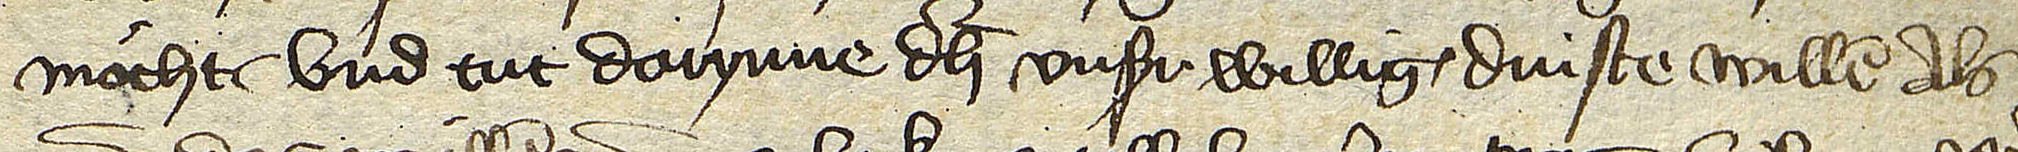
möcht / vnd tut darynne d*h vnſ*r willig* dinſte wille* Als
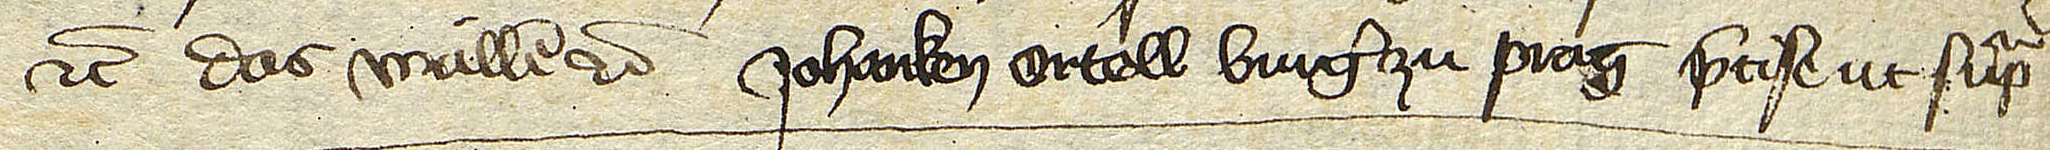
ec* das wölle* ec* Iohanken Ortell burg* cʒu prag p*ciſe ut ſup*
